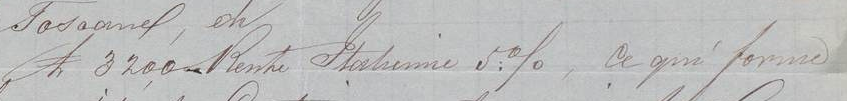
L 3200 Rente Italienne 5%, ce qui forme
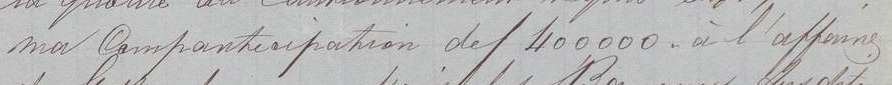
ma Compartecipation de f 400,000– à l'affaire
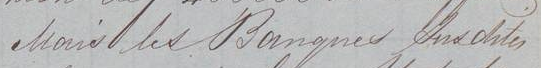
Mais les Banques Insolites
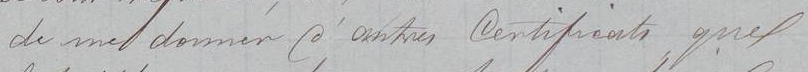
de me donner d'autres Certificats que
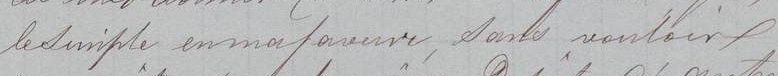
le simple en ma faveur, sans vouloir
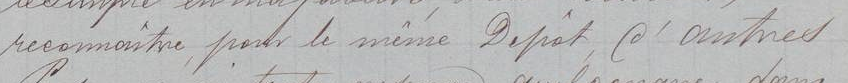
reconnaître, pour le même Depôt, d'autres
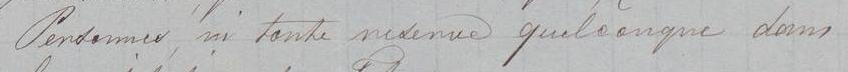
Personnes, ni toute retenue quelconque dans
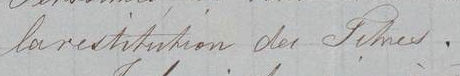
la restitution des Titres.
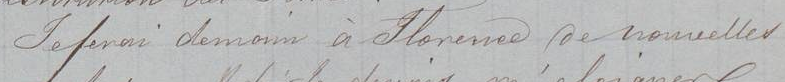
Je ferai demain à Florence de nouvelles
